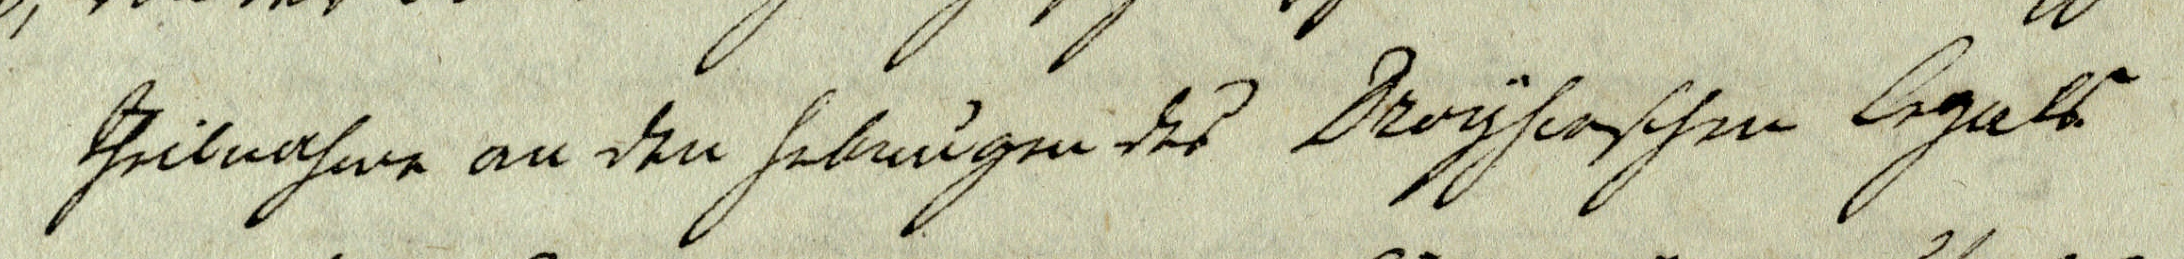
Theilnahme an den Hebungen des Droÿsenschen Legats
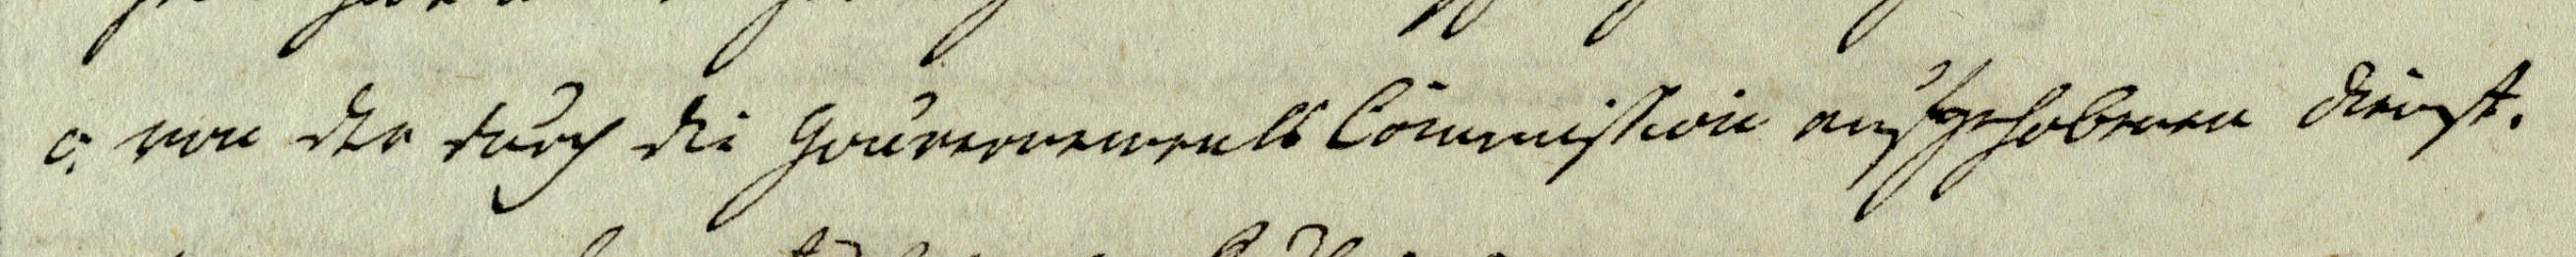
c. von der durch die Gouvernements Commission aufgehobenen Dienst¬
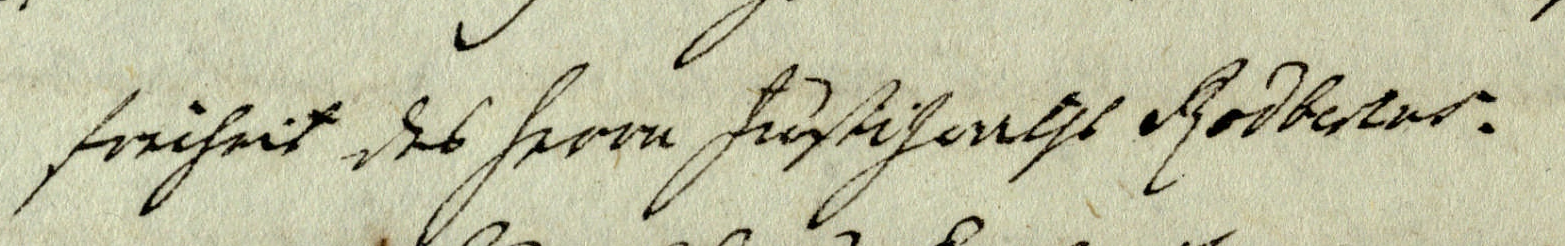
freiheit des Herrn Justizraths Rodbertus.
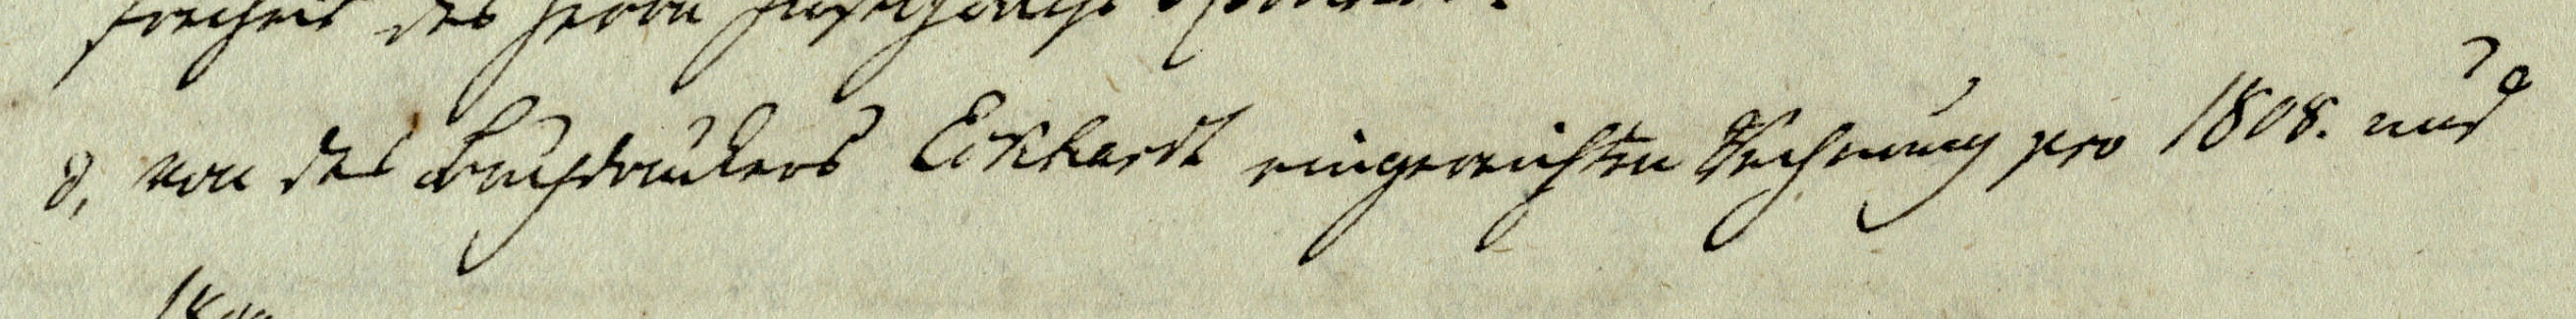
d, von des Buchdruckers Eckhardt eingereichten Rechnung pro 1808. und
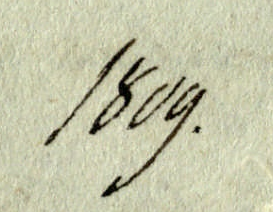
1809.
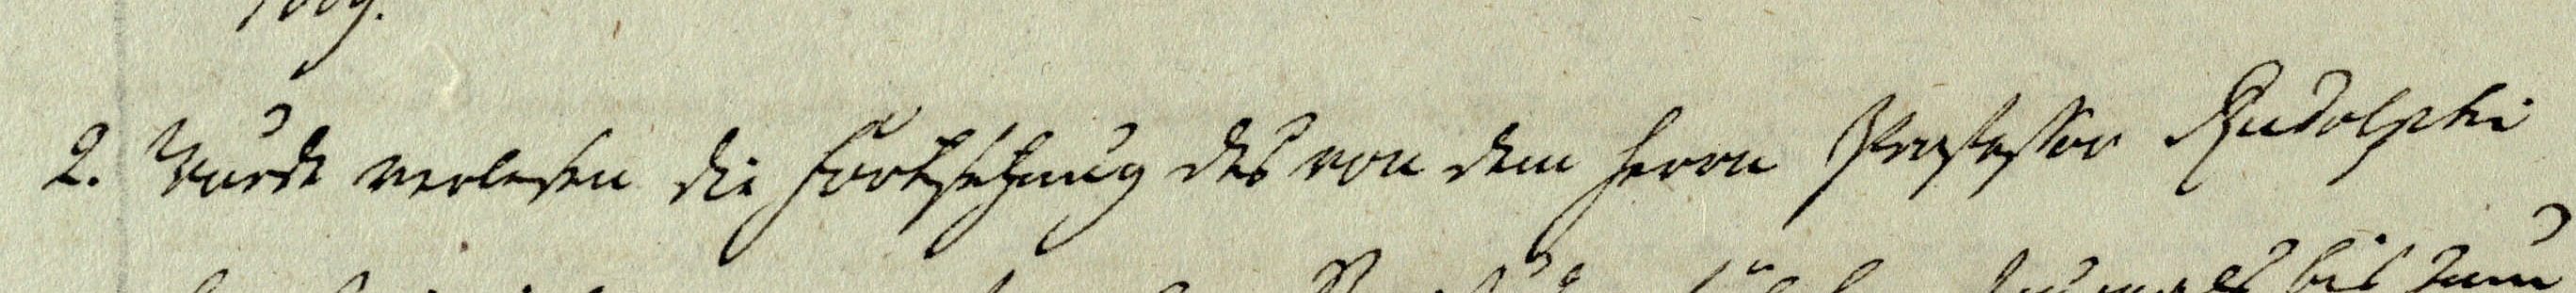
2. Wurde verlesen die Fortsetzung des von dem Herrn Professor Rudolphi
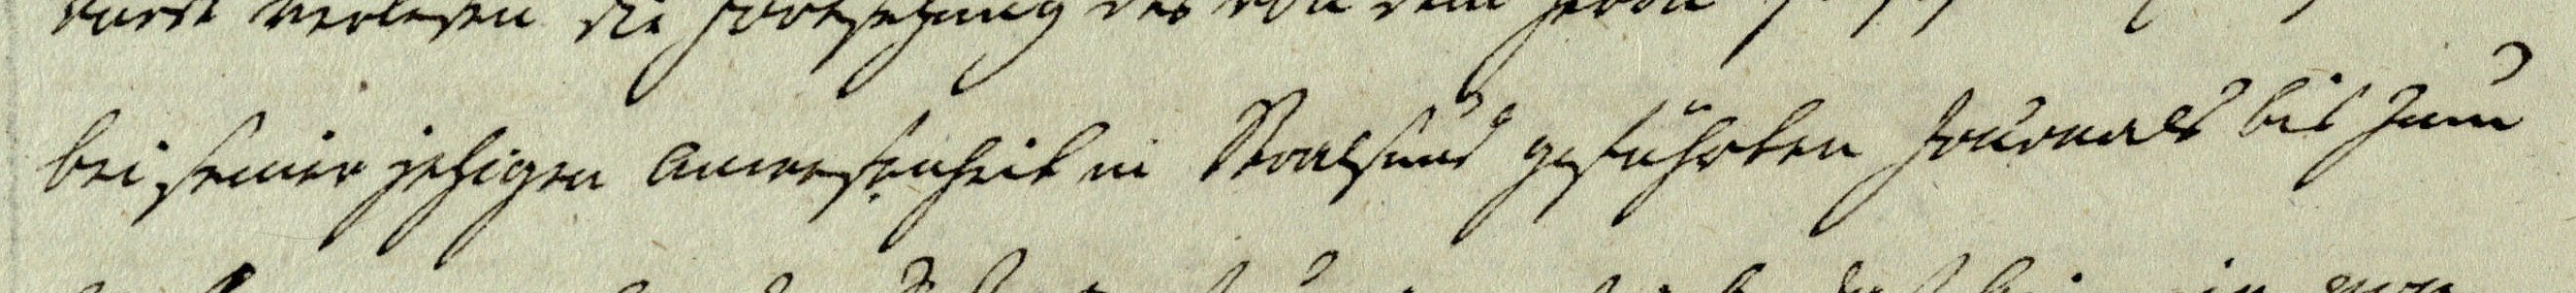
bei seiner jetzigen Anwesenheit in Stralsund geführten Journals bis zum
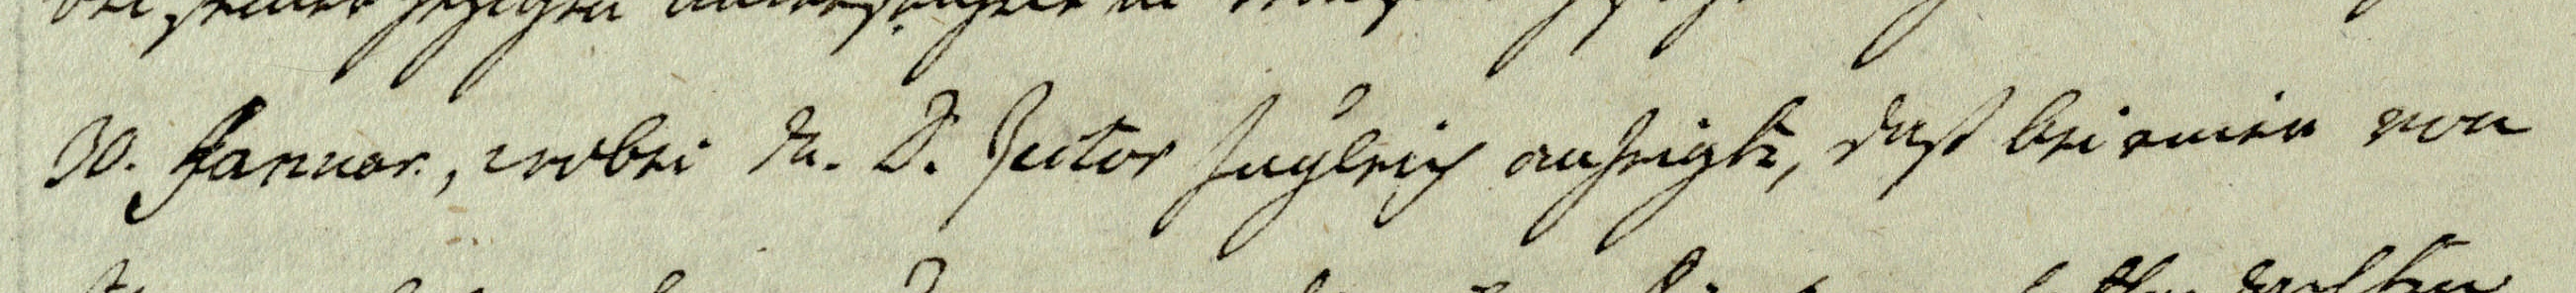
30. Januar, wobei M. D. Rector zugleich anzeigte, daß bei einer von
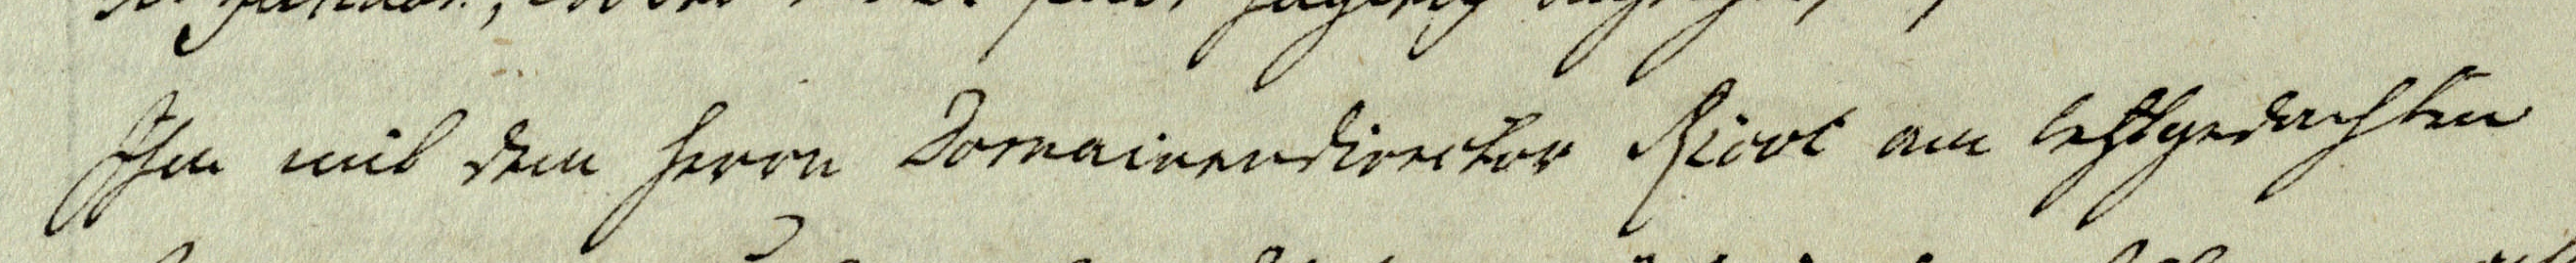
Ihm mit dem Herrn Domainendirector Ricot am letztgedachten
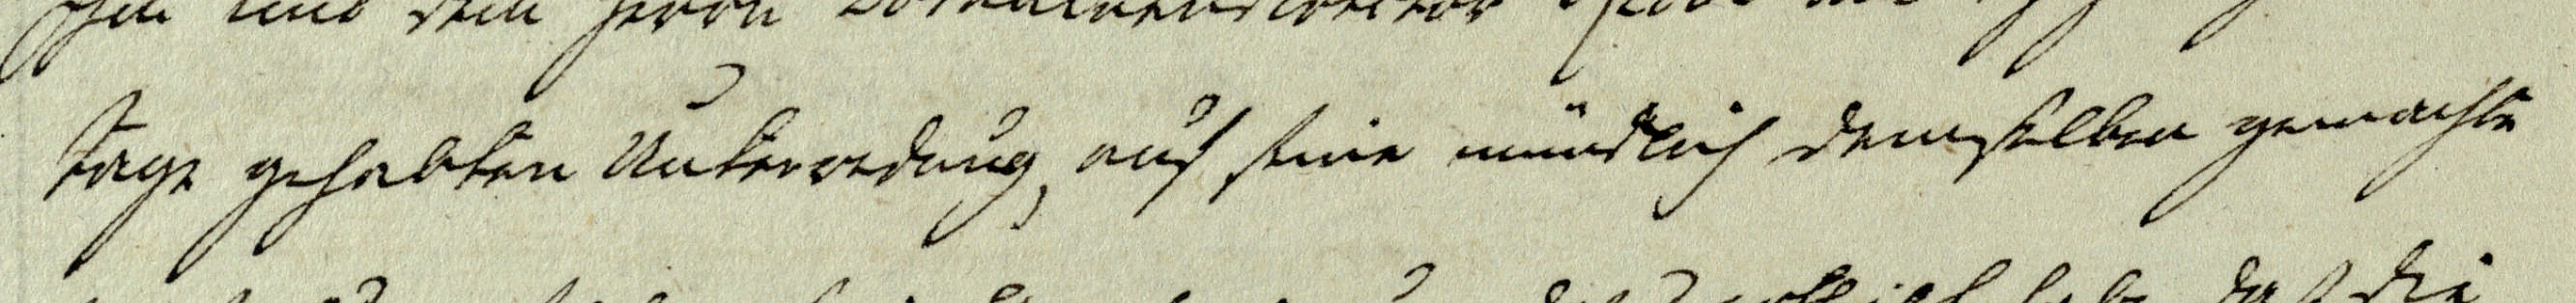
Tage gehabten Unterredung, auf seine mündlich demselben gemachte
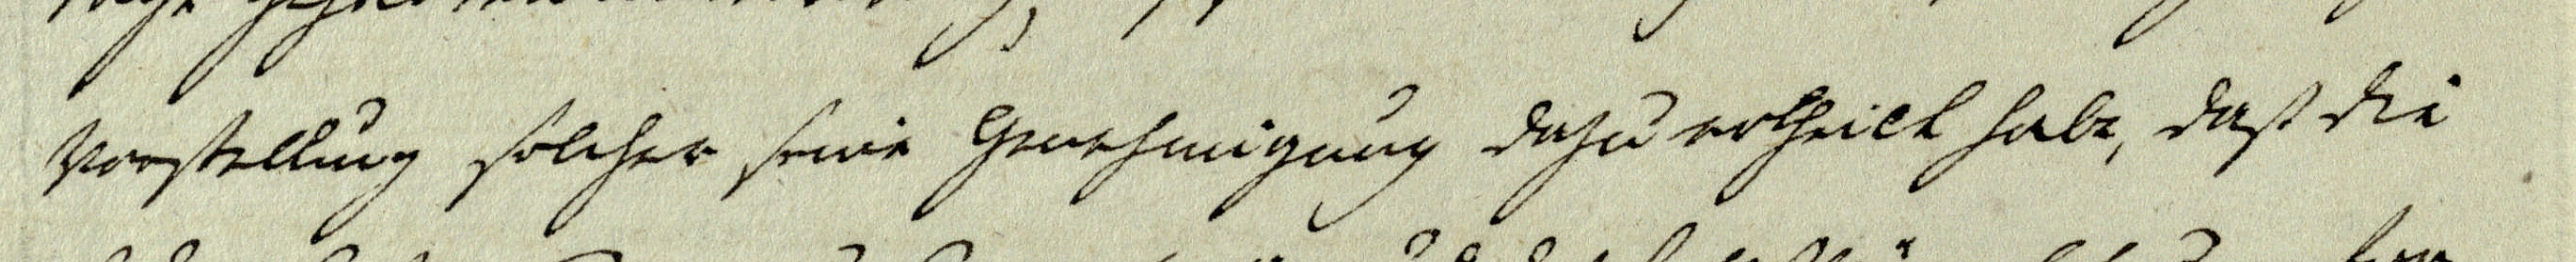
Vorstellung solcher seine Genehmigung dazu ertheilt habe, daß die
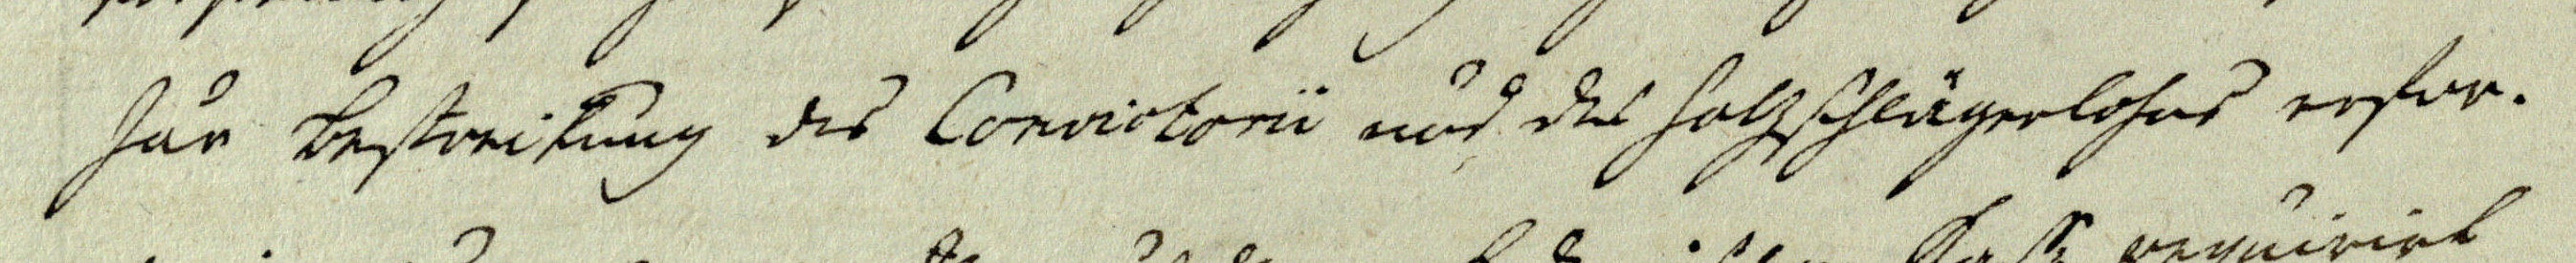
zur Bestreitung des Convictorii und des Holzschlägerlohns erfor¬
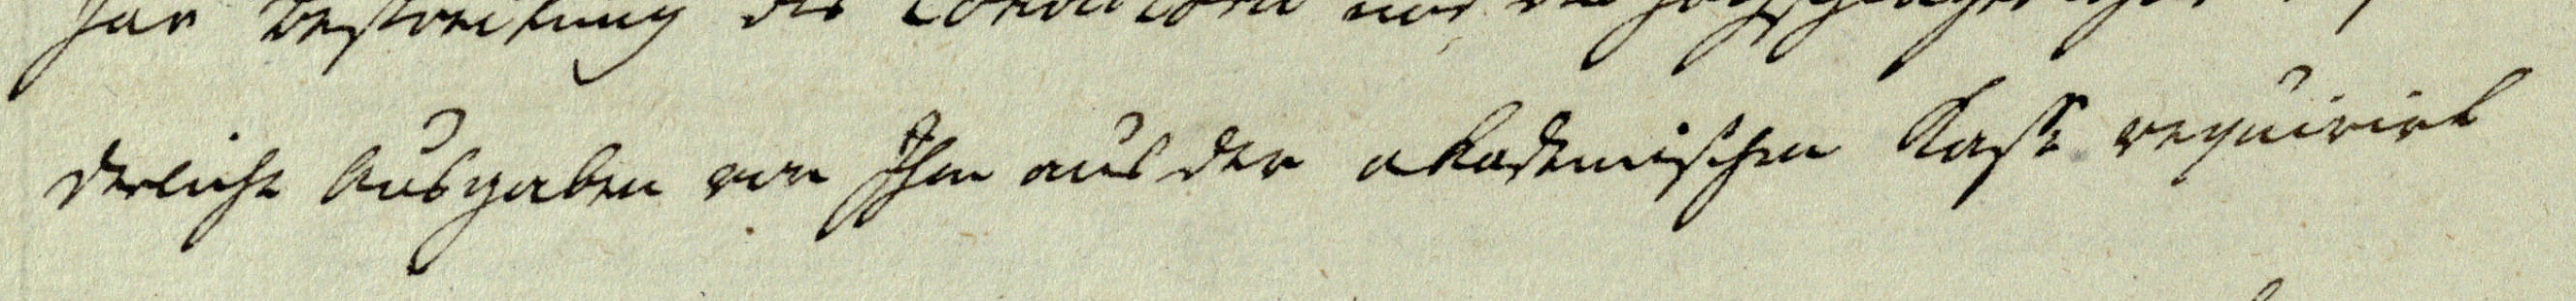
derliche Ausgaben von Ihm aus der akademischen Kasse requirirt
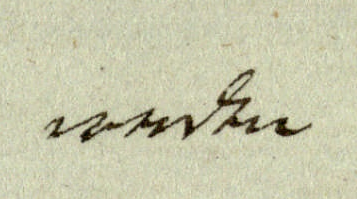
werden
